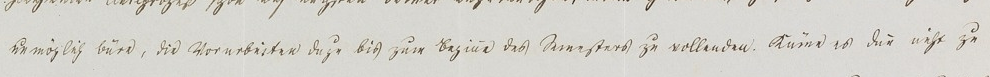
unmöglich wäre, die Vorarbeiten dazu bis zum Beginne des Semesters zu vollenden. Käme es dann nicht zu
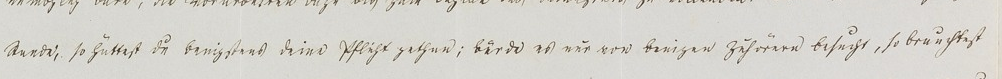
Stande, so hättest Du wenigstens Deine Pflicht gethan; würde es nur von wenigen Zuhörern besucht, so brauchtest
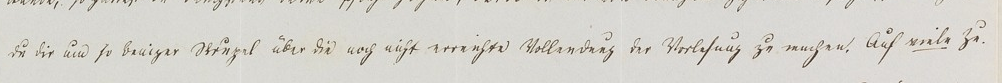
Du Dir um so weniger Skrupel über die noch nicht erreichte Vollendung der Vorlesung zu machen. Auf viele Zu-
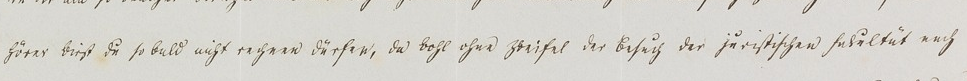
hörer wirst Du so bald nicht rechnen dürfen, da wohl ohne Zweifel der Besuch der juristischen Fakultät nach
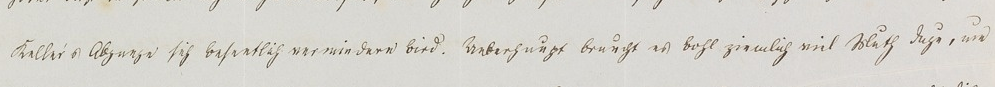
Keller's Abgange sich wesentlich vermindern wird. Ueberhaupt braucht es wohl ziemlich viel Muth dazu, um
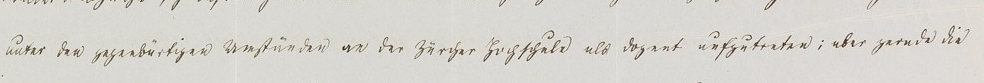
unter den gegenwärtigen Umständen an der Zürcher Hochschule als Dozent aufzutreten; aber gerade die
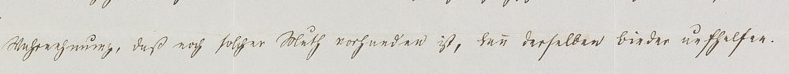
Wahrnehmung, daß noch solcher Muth vorhanden ist, kann derselben wieder aufhelfen.
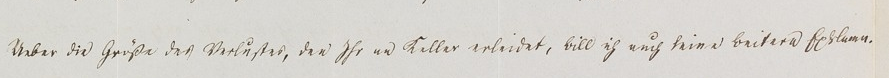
Ueber die Größe des Verlustes, den Ihr an Keller erleidet, will ich auch keine weitern Exklama-
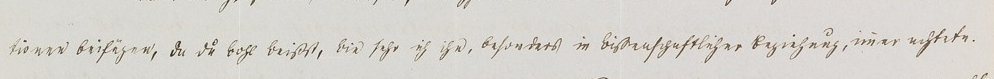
tionen beifügen, da Du wohl weißst, wie sehr ich ihn, besonders in wissenschaftlicher Beziehung, immer achtete.
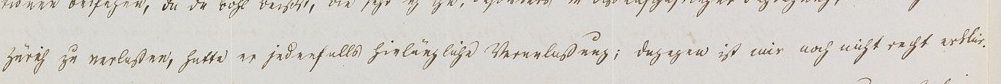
Zürich zu verlassen, hatte er jedenfalls hinlängliche Veranlassung; dagegen ist mir noch nicht recht erklär-
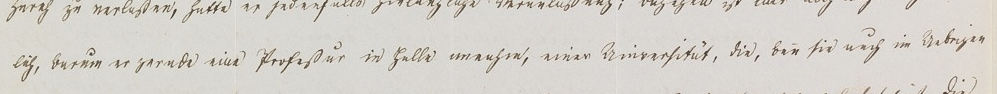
lich, warum er gerade eine Professur in Halle annahm, einer Universität, die, wenn sie auch im Uebrigen
